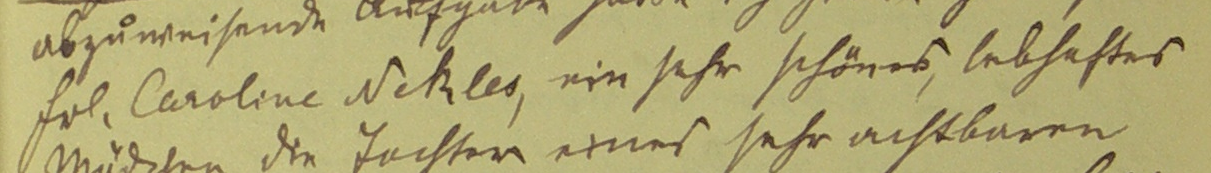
Frl. Caroline Neckles, ein sehr schönes, lebhaftes
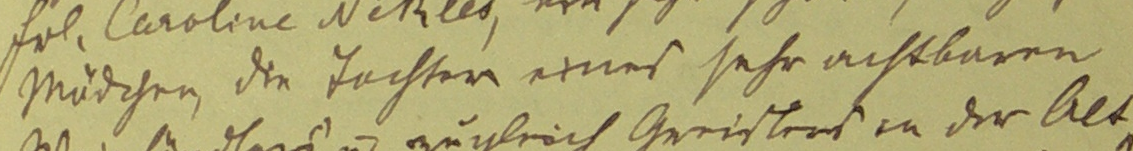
Mädchen, die Tochter eines sehr achtbaren
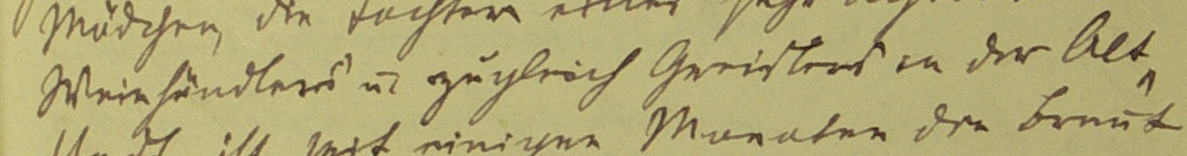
Weinhändlers und zugleich ? Greisters in der Alt¬
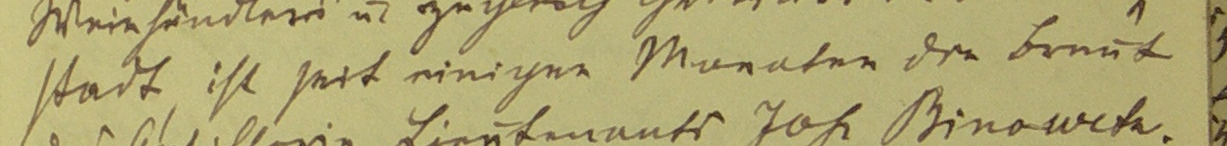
stadt ist seit einigen Monaten die Braut
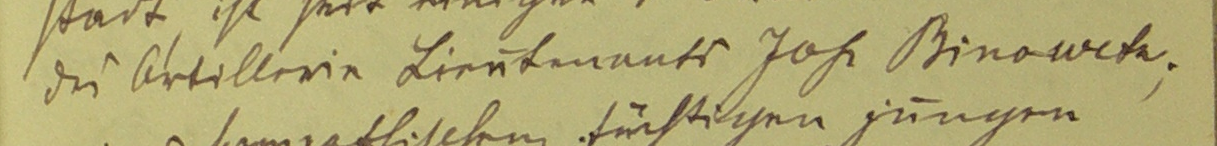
des Artillerie Lieutenants Joh. Binoweta-
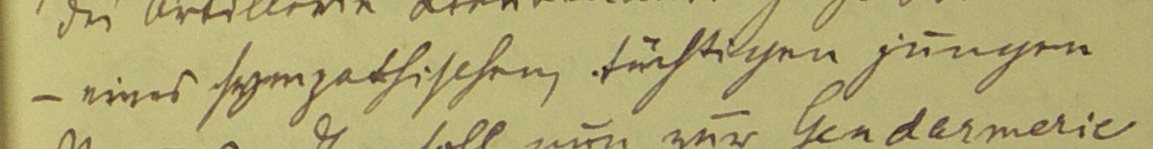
eines sympathischen, tüchtigen jungen
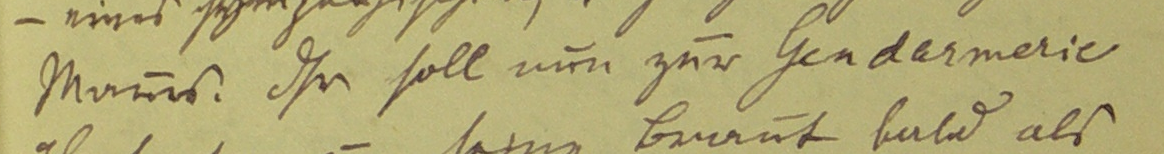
Mannes. Er soll nun zur Gendarmarie
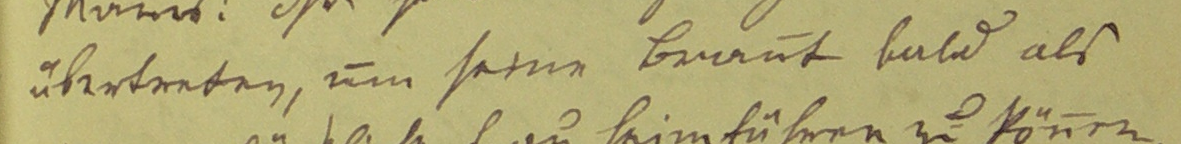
übertreten, um seine Braut bald als
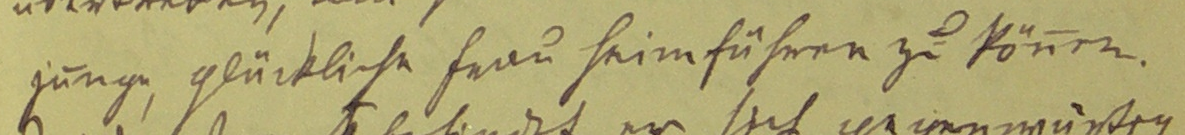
junge, glückliche Frau heimführen zu können.
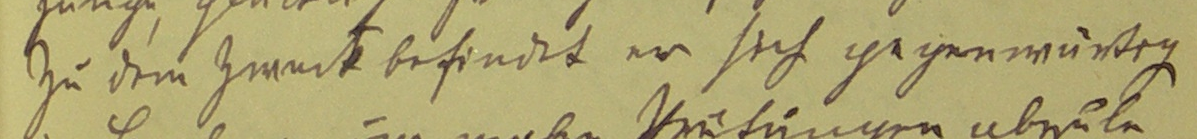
Zu dem Zweck befindet er sich gegenwärtig
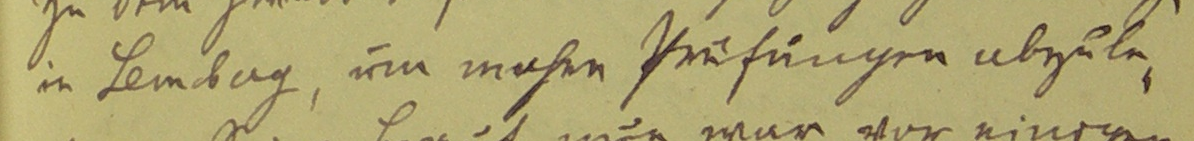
in Lemberg, um mehrere Prüfungen abzule¬
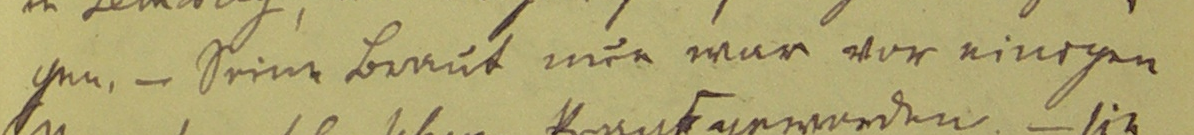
gen.- SeineBraut nun war vor einigen
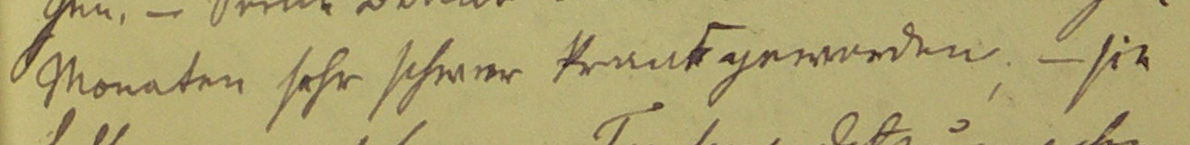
Monaten sehr schwer krank geworden, sie
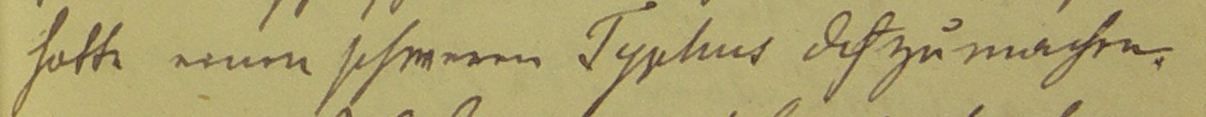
hatte einen schweren Typhus durchzumachen.
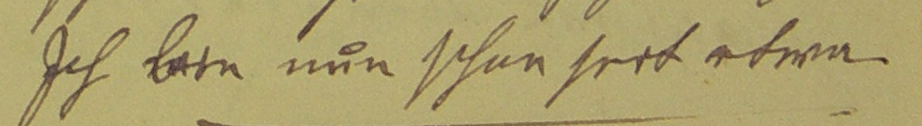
Ich bin nun schon seit etwa
